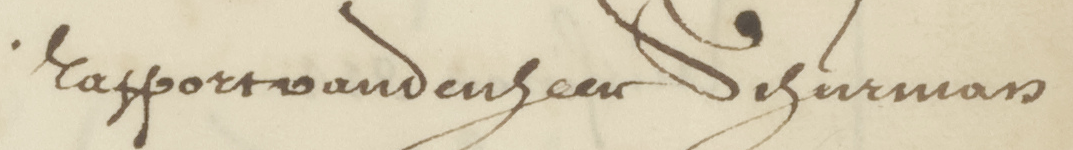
rapport vanden heer Schurman
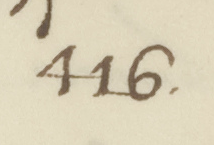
416.
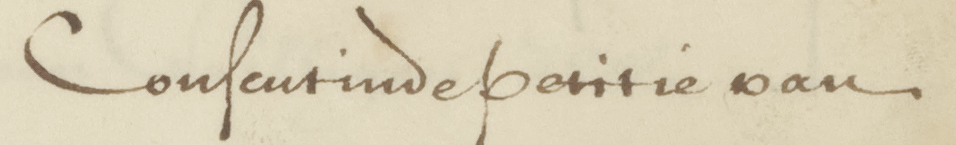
Consent inde petitie van
